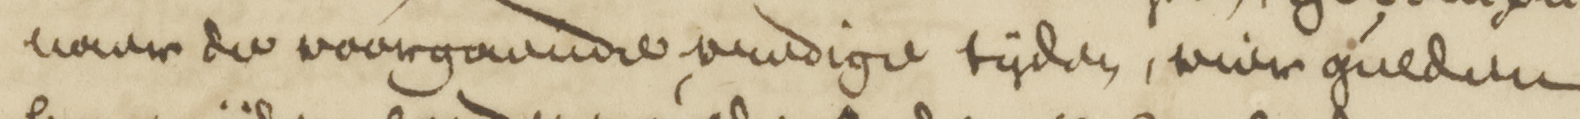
naer de voorgaende vredige tijden, vier gulden
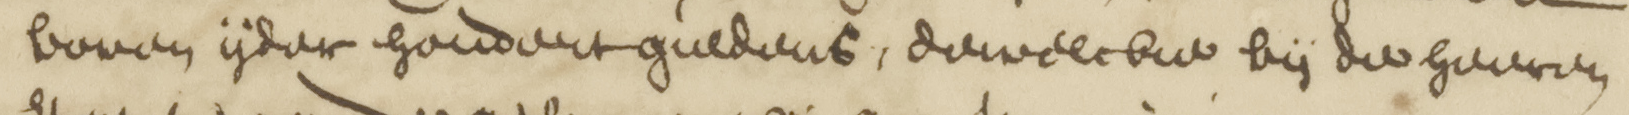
boven ijder hondert gudens, dewelcke bij de heeren
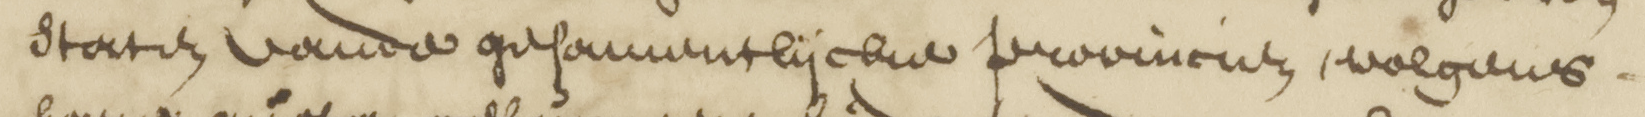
Staten vande gesamentlijcke provincien, volgens
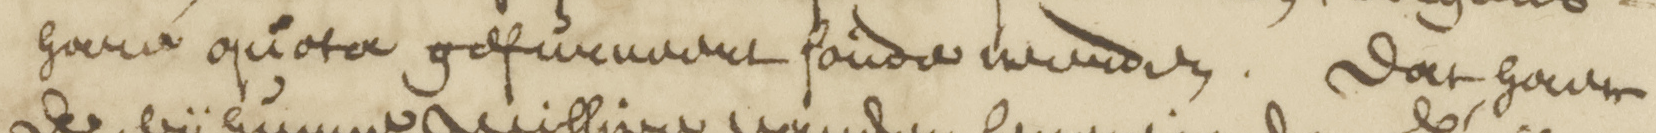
hare quota gefurneert soude werden. Dat haer
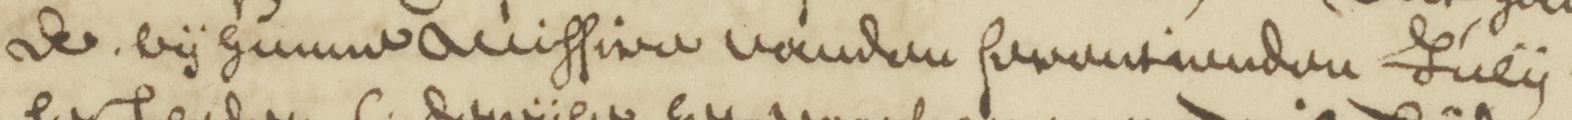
E. bij hunne missive vanden seventienden Julij
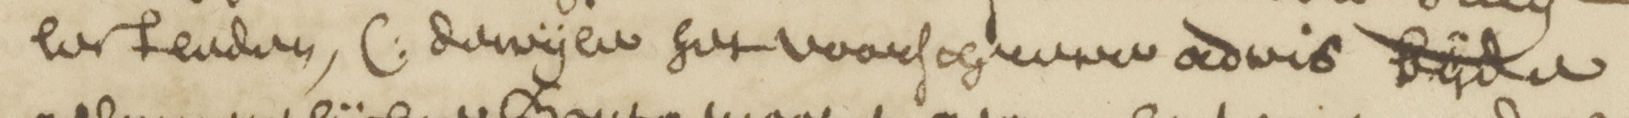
lestleden, (: dewijle het voorschreve advis bijde
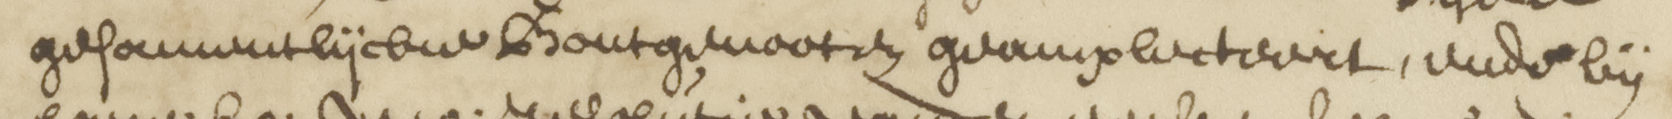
gesamentlijcke Bontgenooten geamplecteert, ende bij
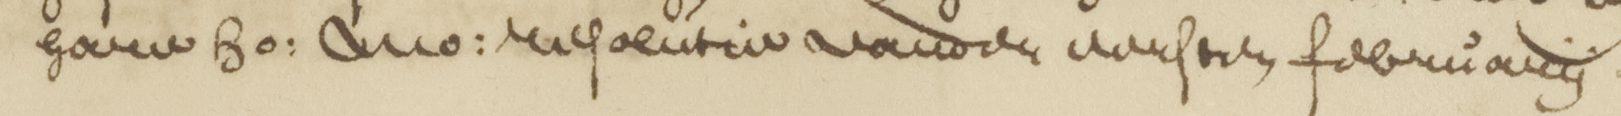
hare Ho:Mo: resolutie vanden eersten februarij
